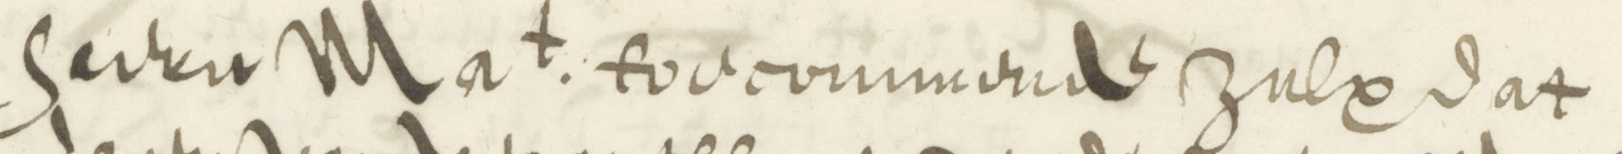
haere Mat. toecommende zulx dat
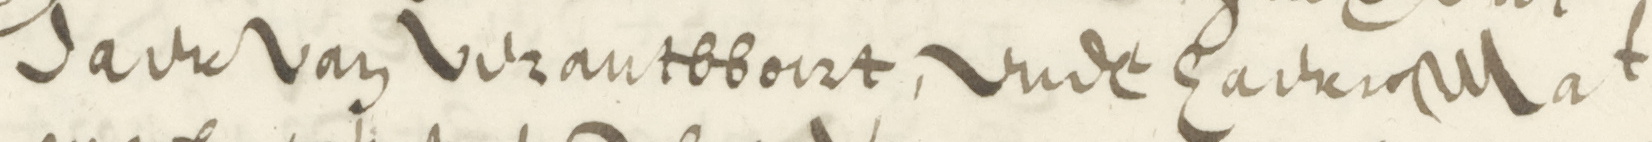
daer van verantwoirt, ende haere Mat.
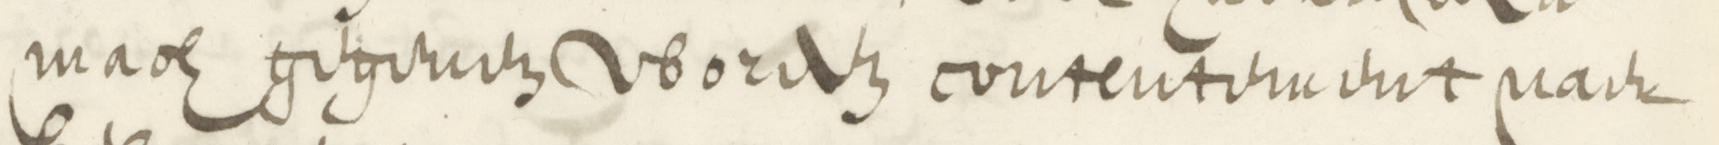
mach gegeuen worden contentement naer
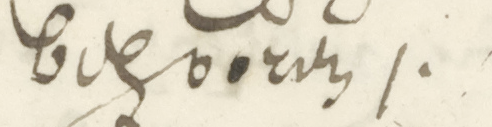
behooren.
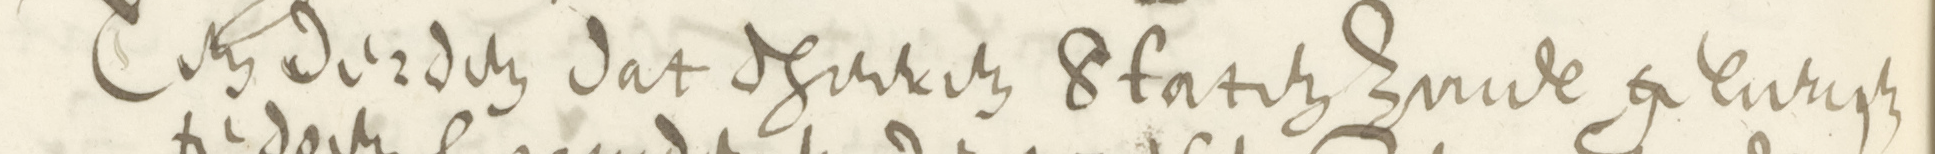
Ten derden dat dheeren Staten zoude gelieuen
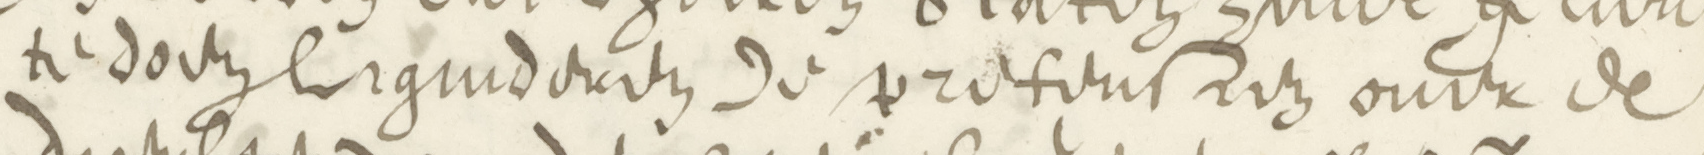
te doen liquideren de pretensien ouer de
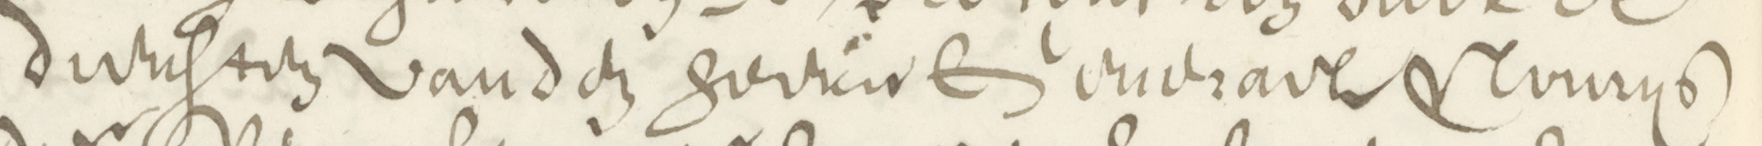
diensten vanden heere Generael Nourys
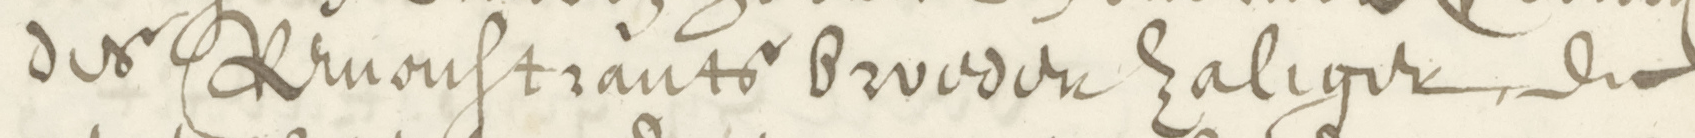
des Remonstrants broeder zaliger, de
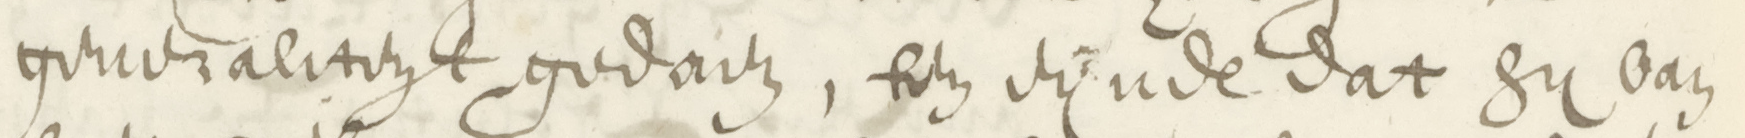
generaliteyt gedaen, ten eynde dat hy van
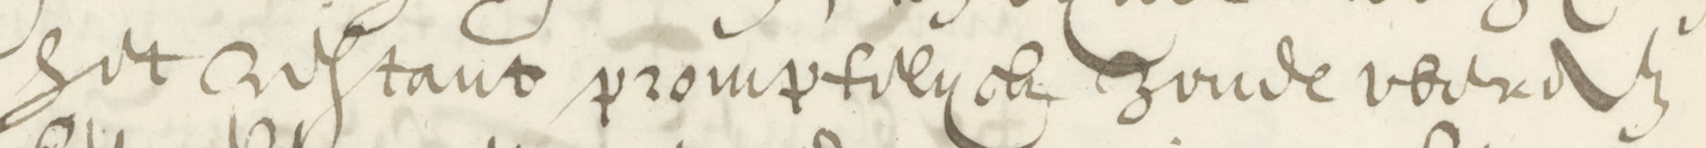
het restant promptelyck zoude werden
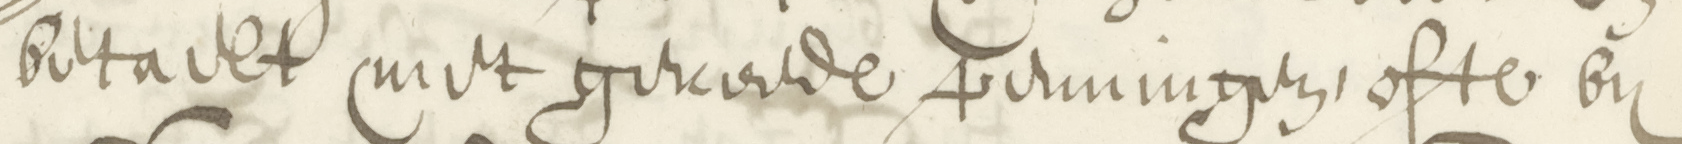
betaelt met gereede penningen, ofte by
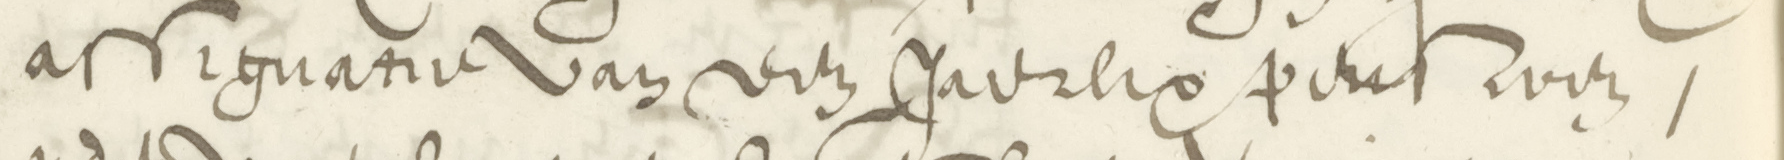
assignatie van een Jaerlix pensioen.
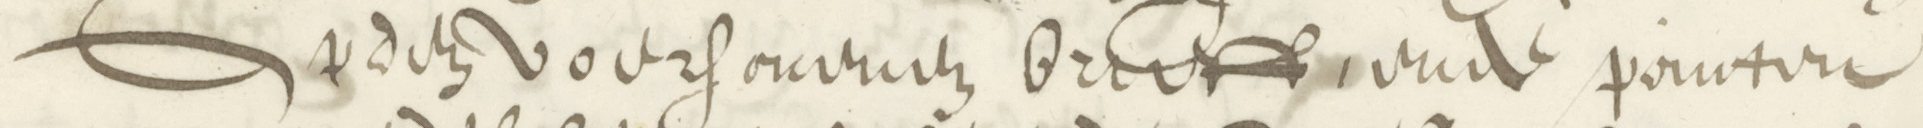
Opden voerscreuen brieff, ende pointen
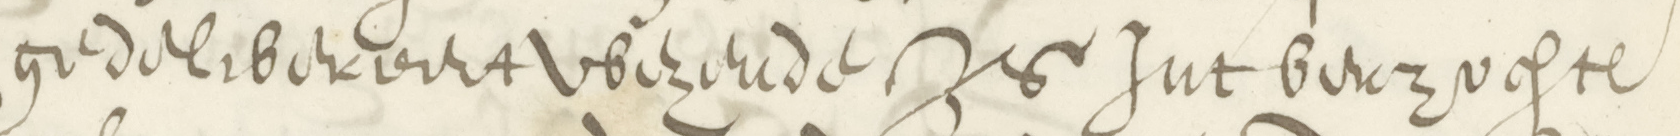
gedelibereert wezende Is int verzochte
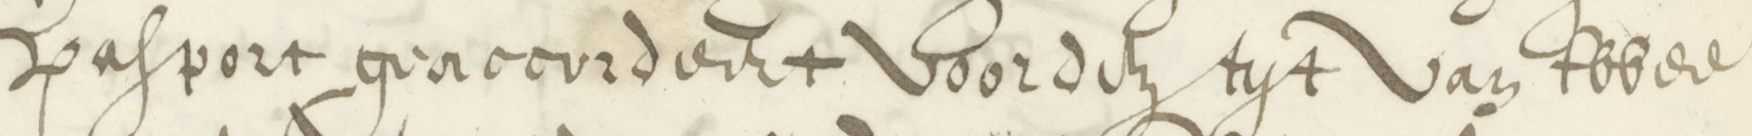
pasport geaccordeert voorden tyt van twee
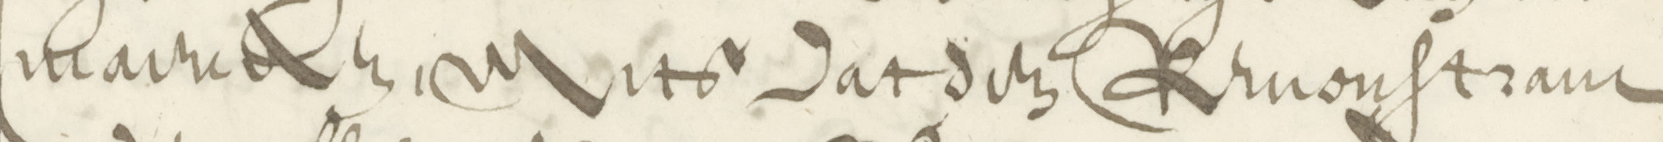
maenden, mits dat den Remonstrant
